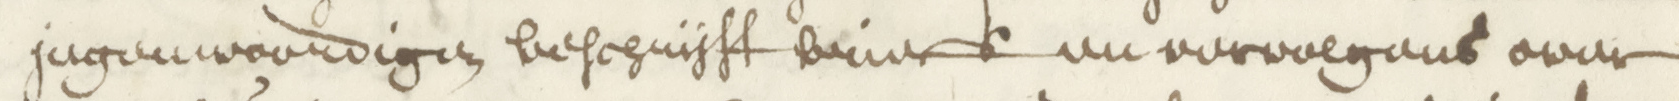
jegenwoordigen beschrijff brieff en vervolgens over
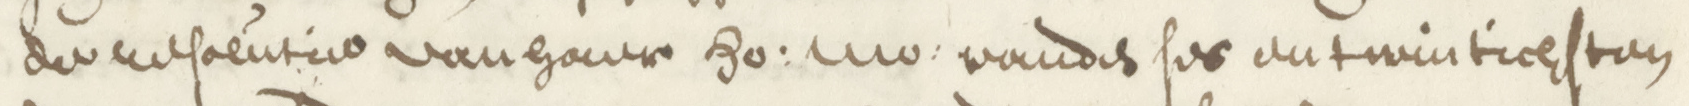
de resolutie van haer Ho:Mo: vanden ses entwintichsten
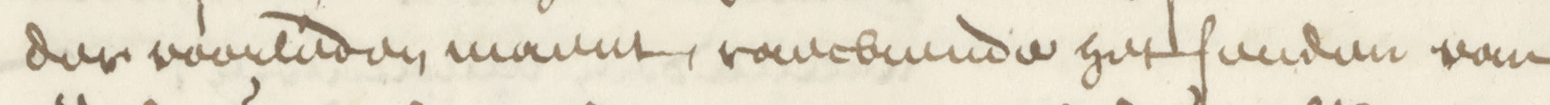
der voorleden maent, raeckende het senden van
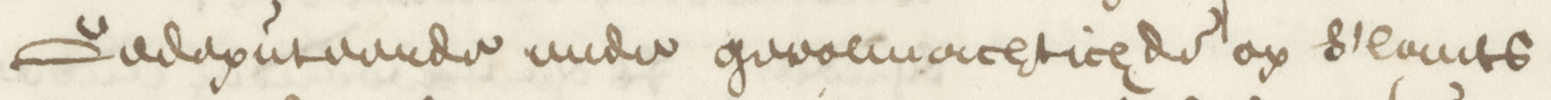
Gedeputeerde ende gevolmachtichde op s'lants
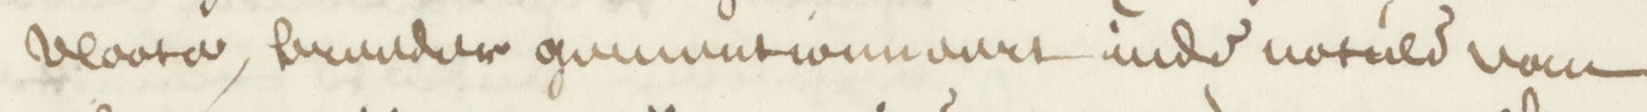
vloote, breeder gementionneert inde notule van
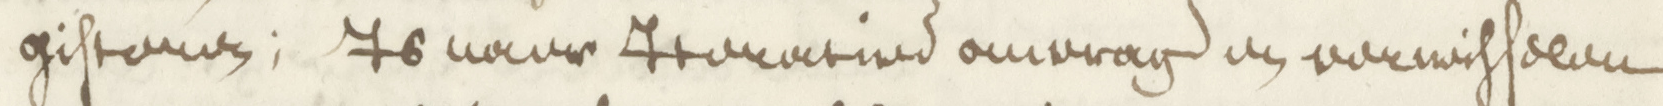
gisteren: Is naer Iterative omvrage en verwisselen
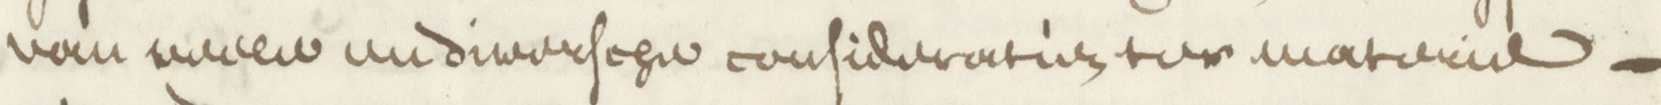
van veele en diversche consideratien ter materie
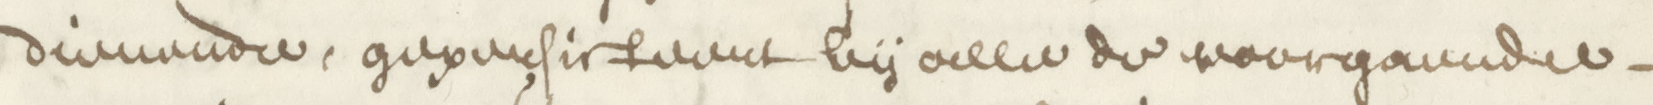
dienende, gepersisteert bij alle de voorgaende
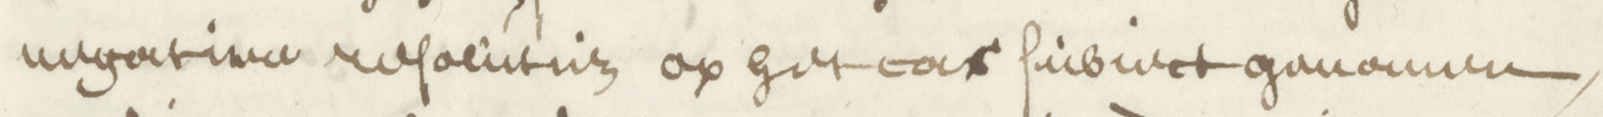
negative resolutien op het cas subiect genomen
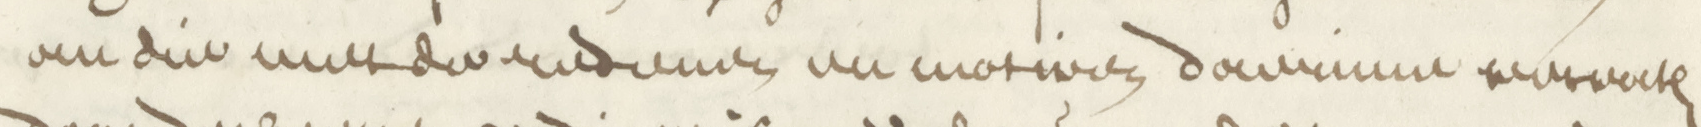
en die met de redenen en motiven daerinne vervath
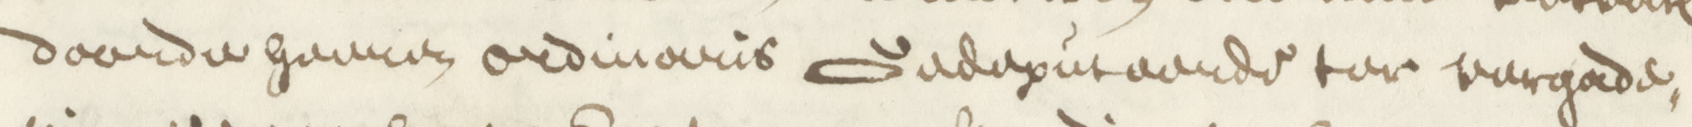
door de heeren ordinaris Gedeputeerde ter vergade,,
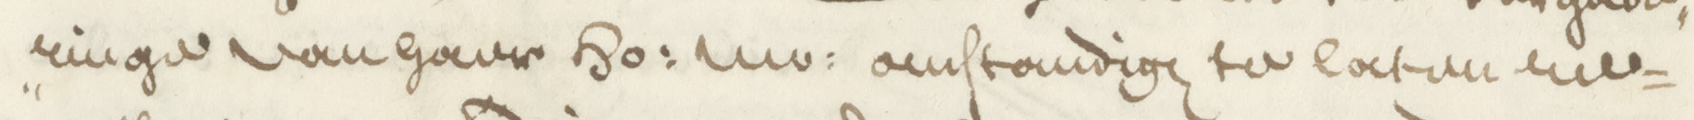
„ringe van haer Ho:Mo: omstandigh te laten re=
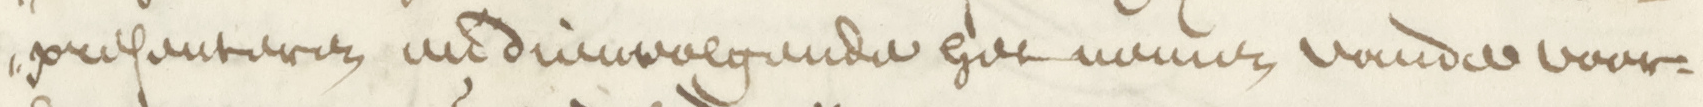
„presenteren en dienvolgende het nemen vande voor„
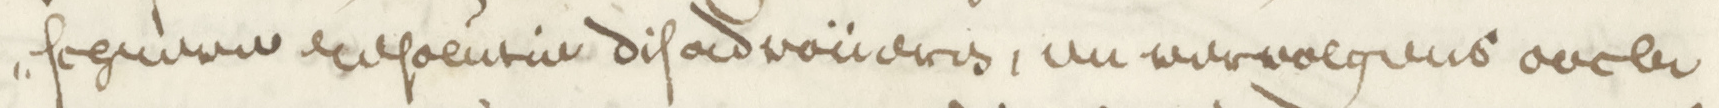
„schreve resolutie disadvoueren, en vervolgens oock
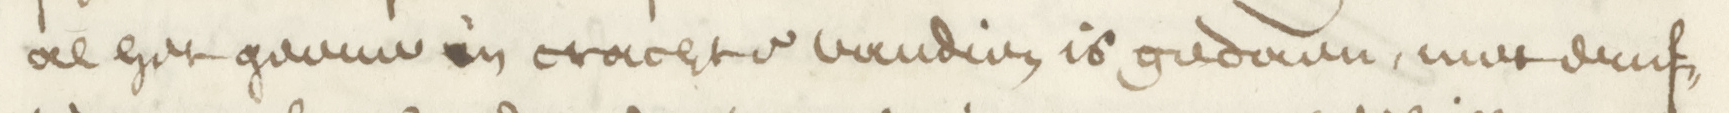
al het geene in crachte vandien is gedaen, met erns,,
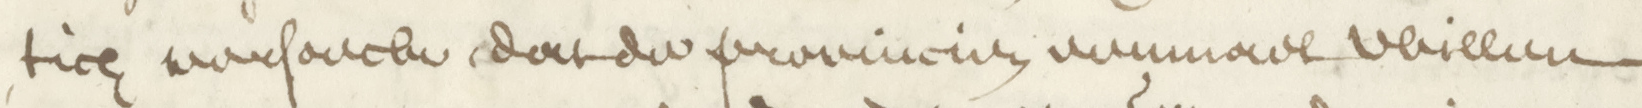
„tich versoeck, dat de provincien eenmael willen
